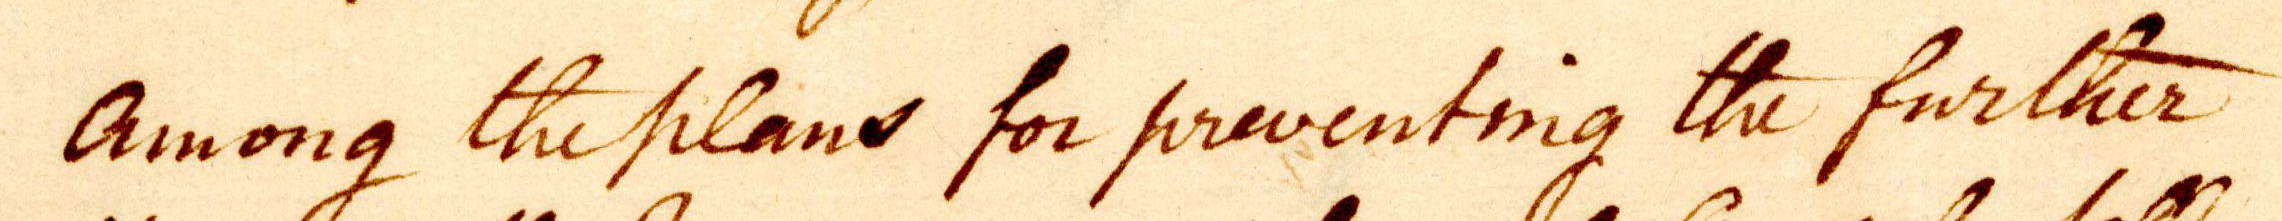Among the plans for preventing the further
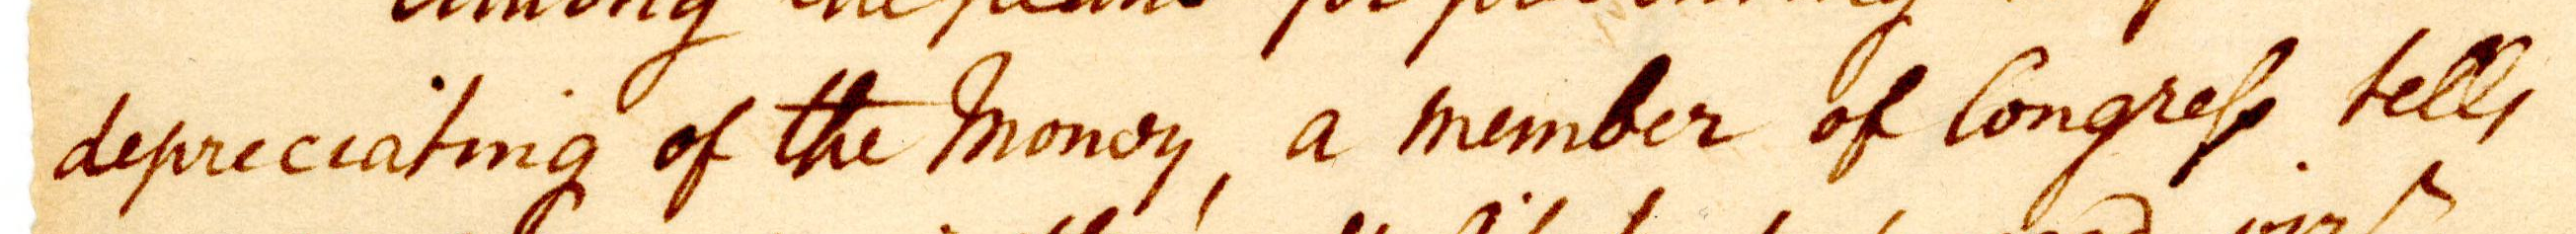depreciating of the Money, a member of Congress tells
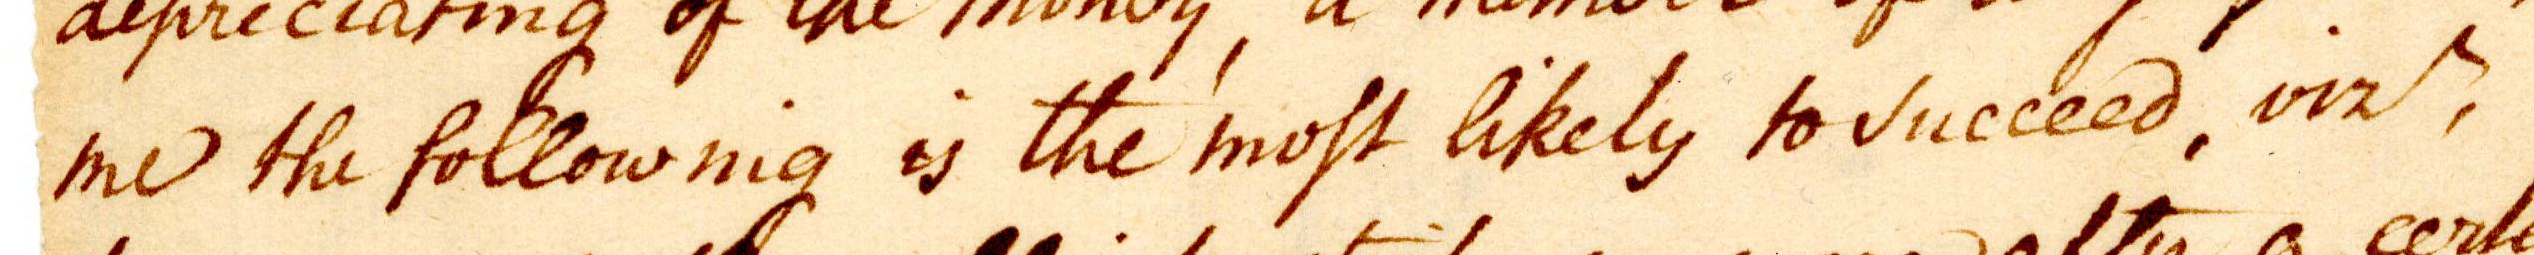me the following is the most likely to succeed, viz^t,
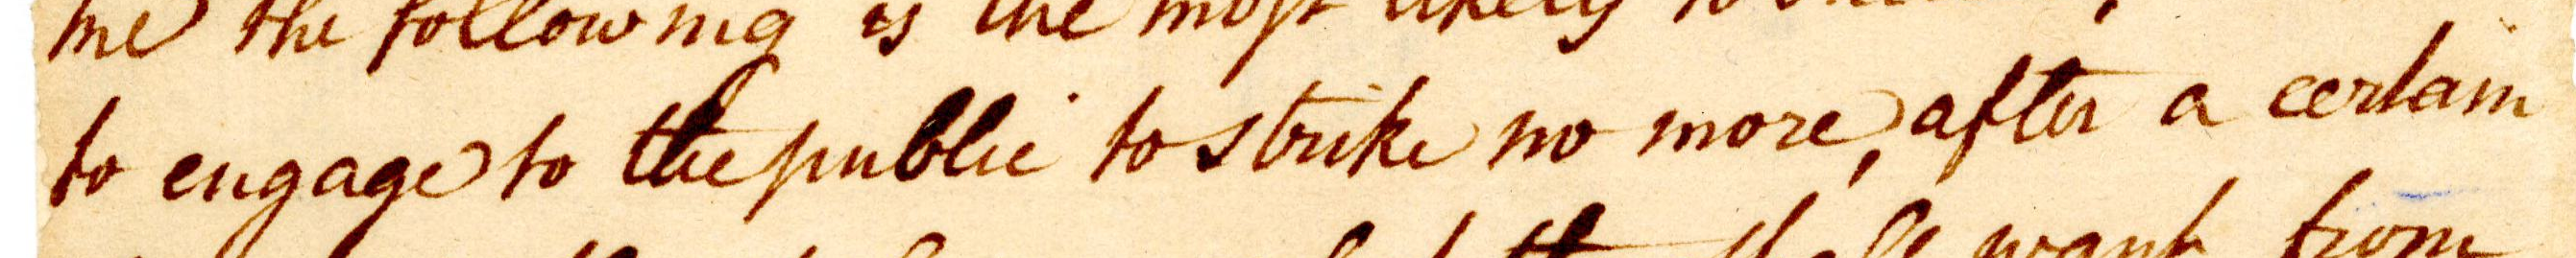to engage to the public to strike no more, after a certain
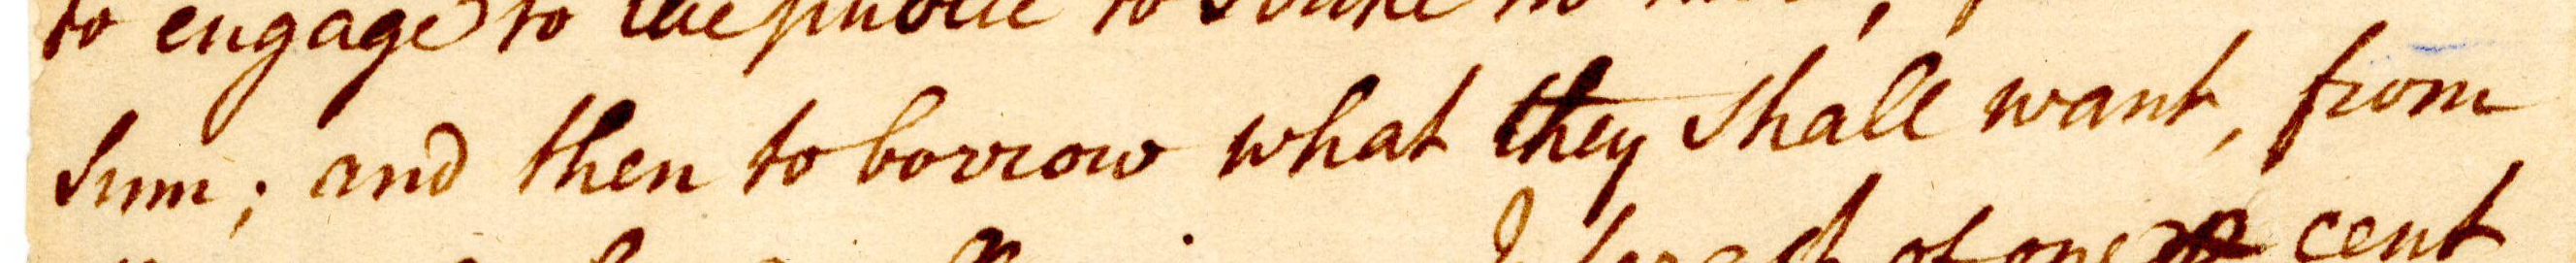sum; and then to borrow what they shall want, from
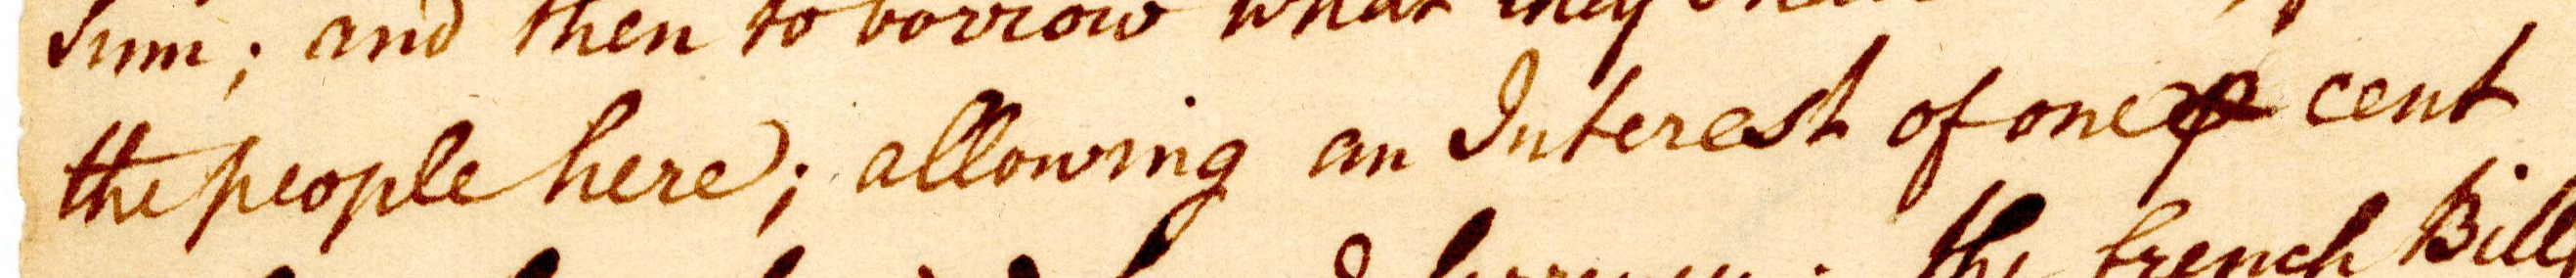the people here; allowing an Interest of one cent
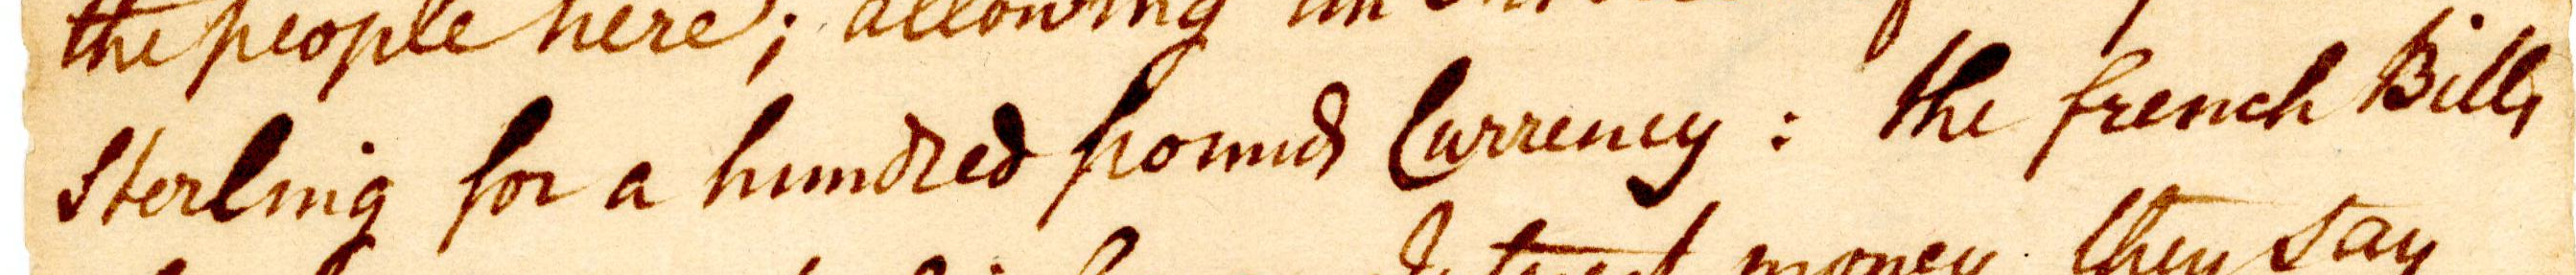Sterling for a hundred pounds Currency: the french Bills
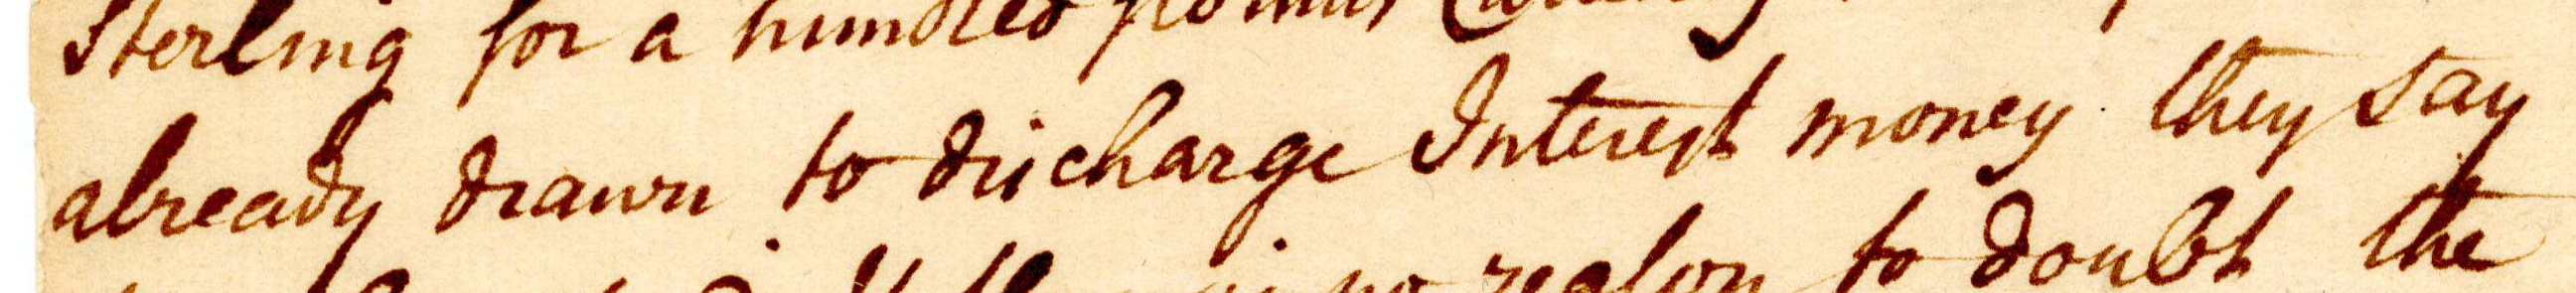already drawn to discharge Interest money they say
